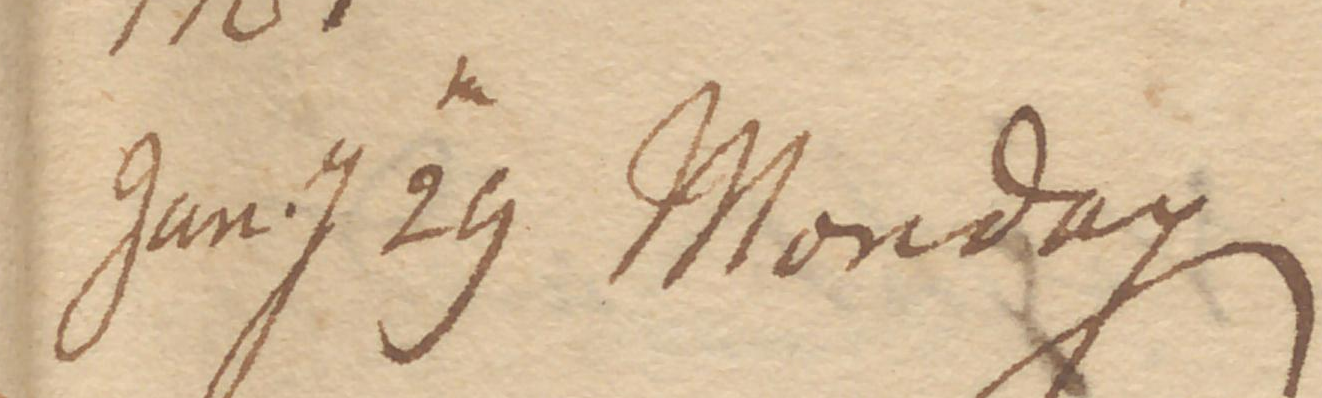Jan^y. 29^th Monday
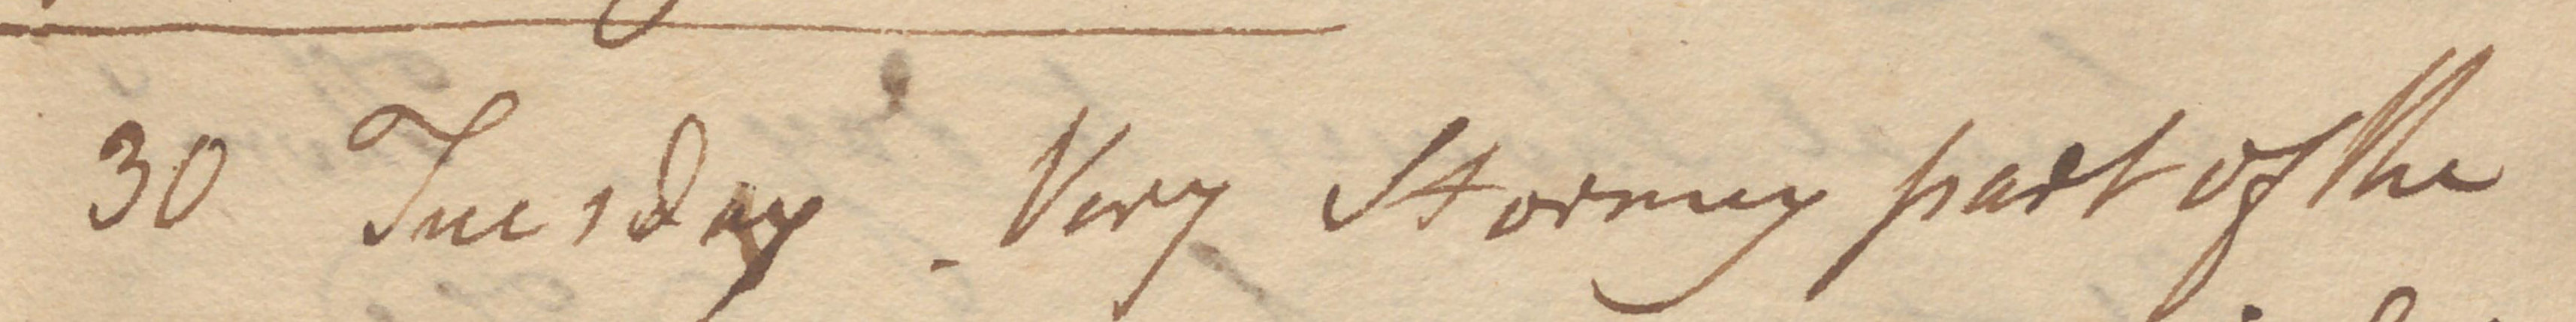30 Tuesday Very Stormy part of the
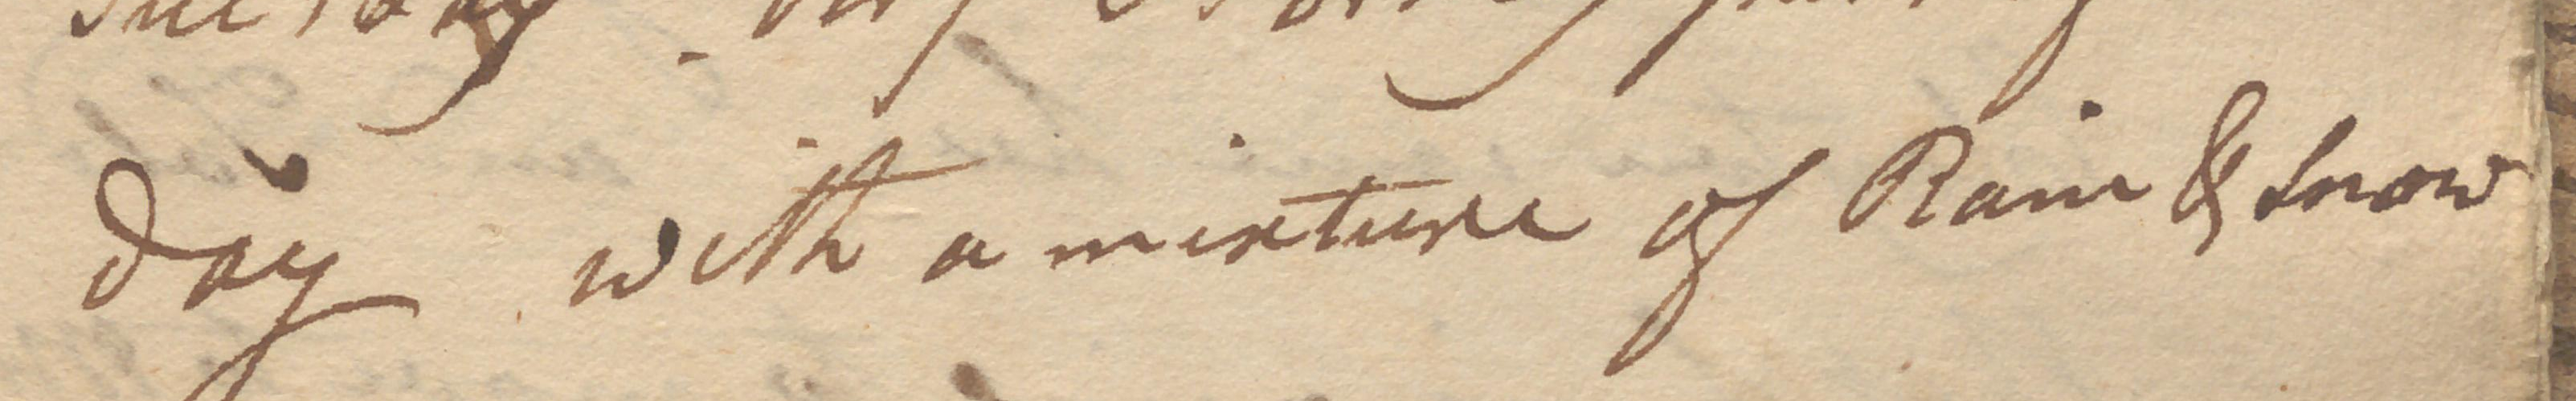day with a mixture of Rain & snow
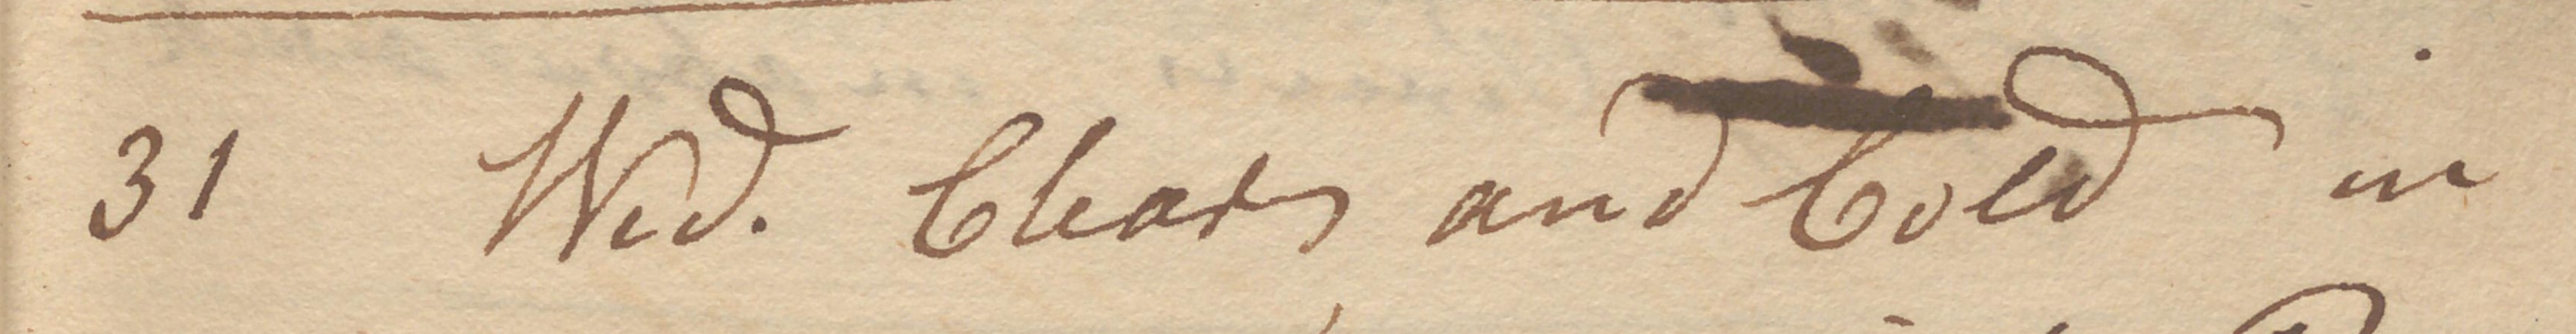31 Wed. Clear and Cold in
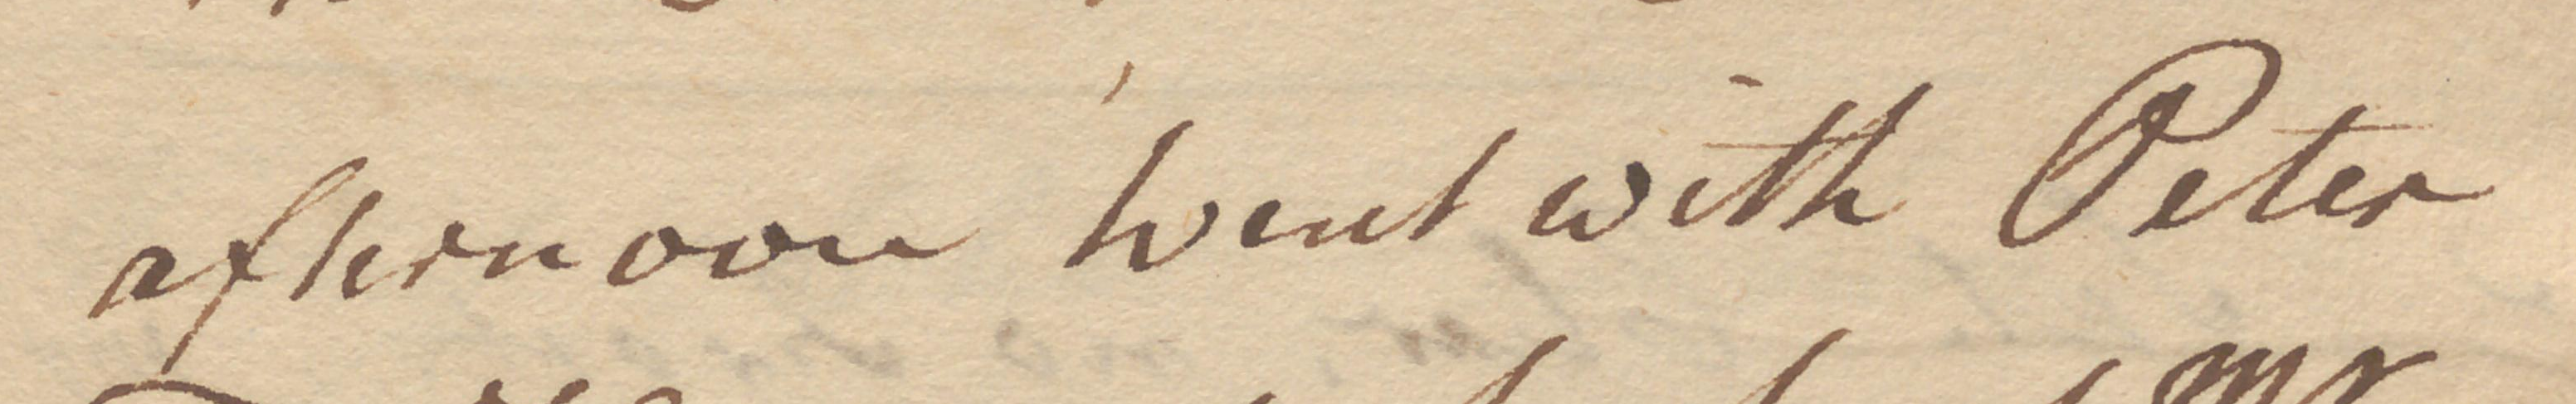afternoon went with Peter
